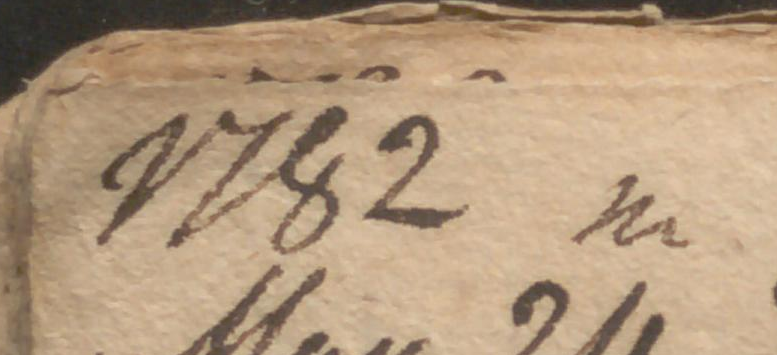1782
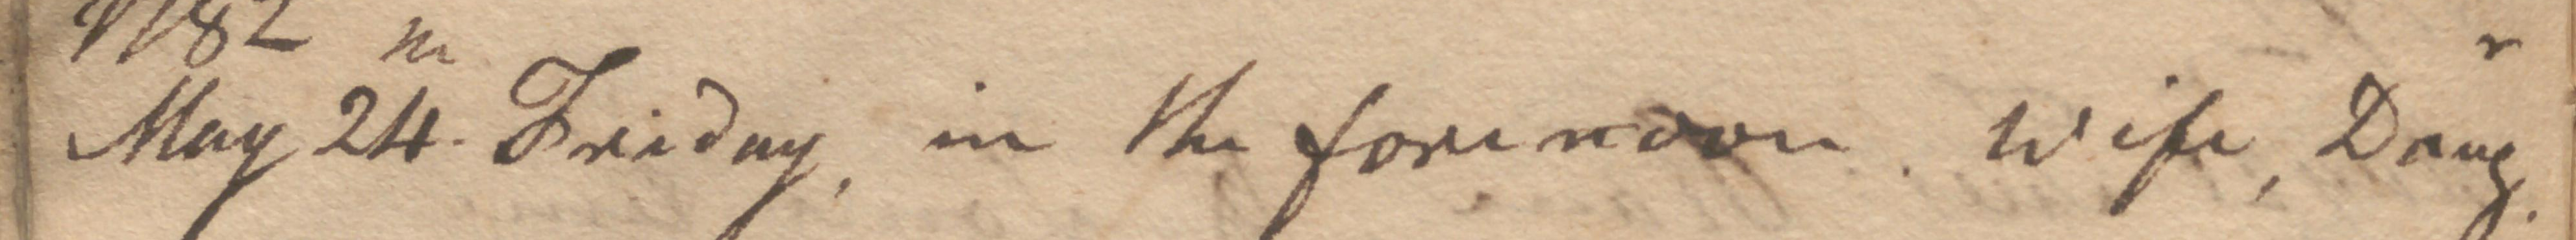May 24^th. Friday in the forenoon wife, Daug^r
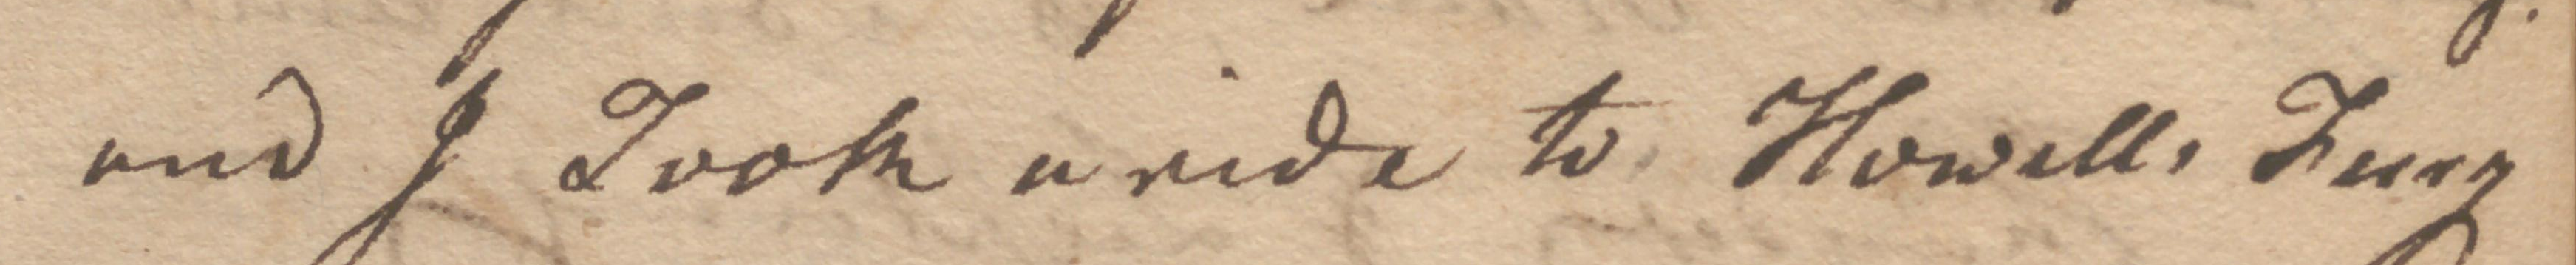and I Took a ride to Howells Ferry
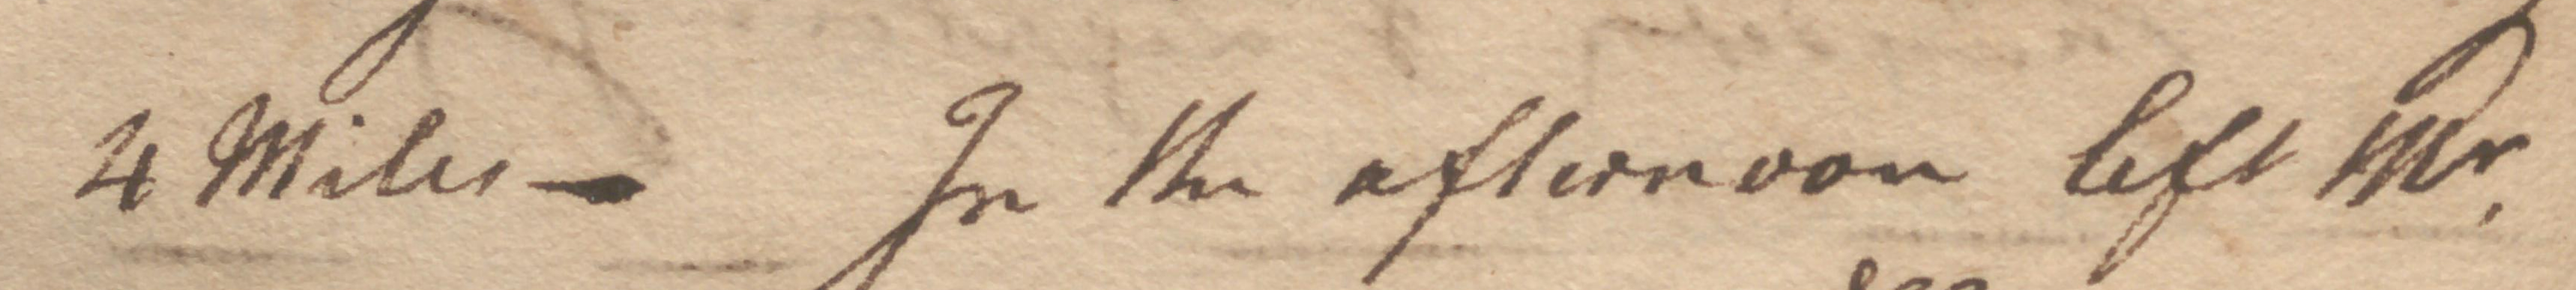4 Miles- In the afternoon left M^r.
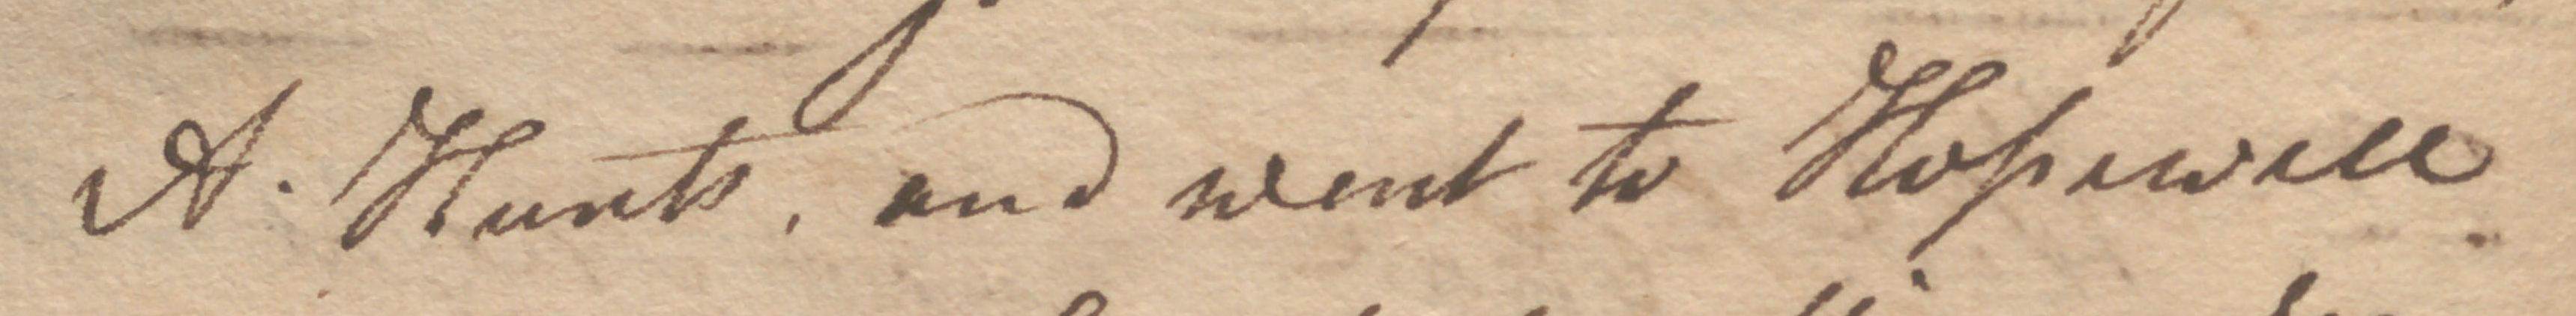A. Hunts, and went to Hopewell
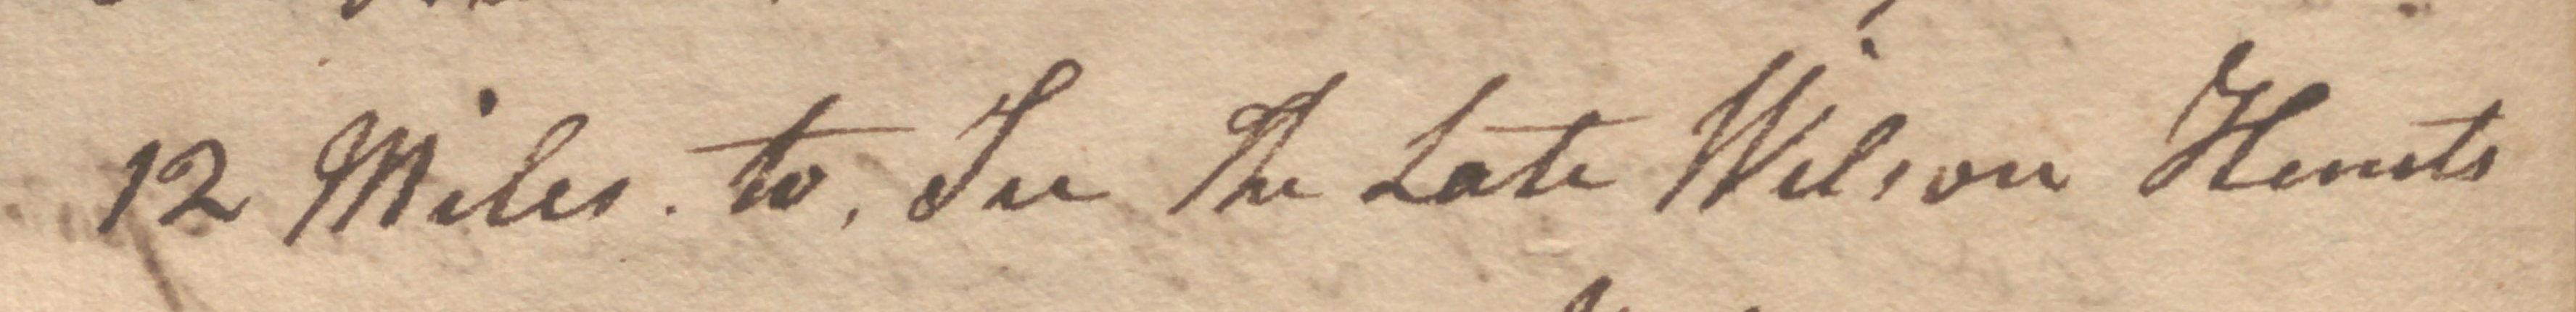12 Miles to See The Late Wilson Hunts
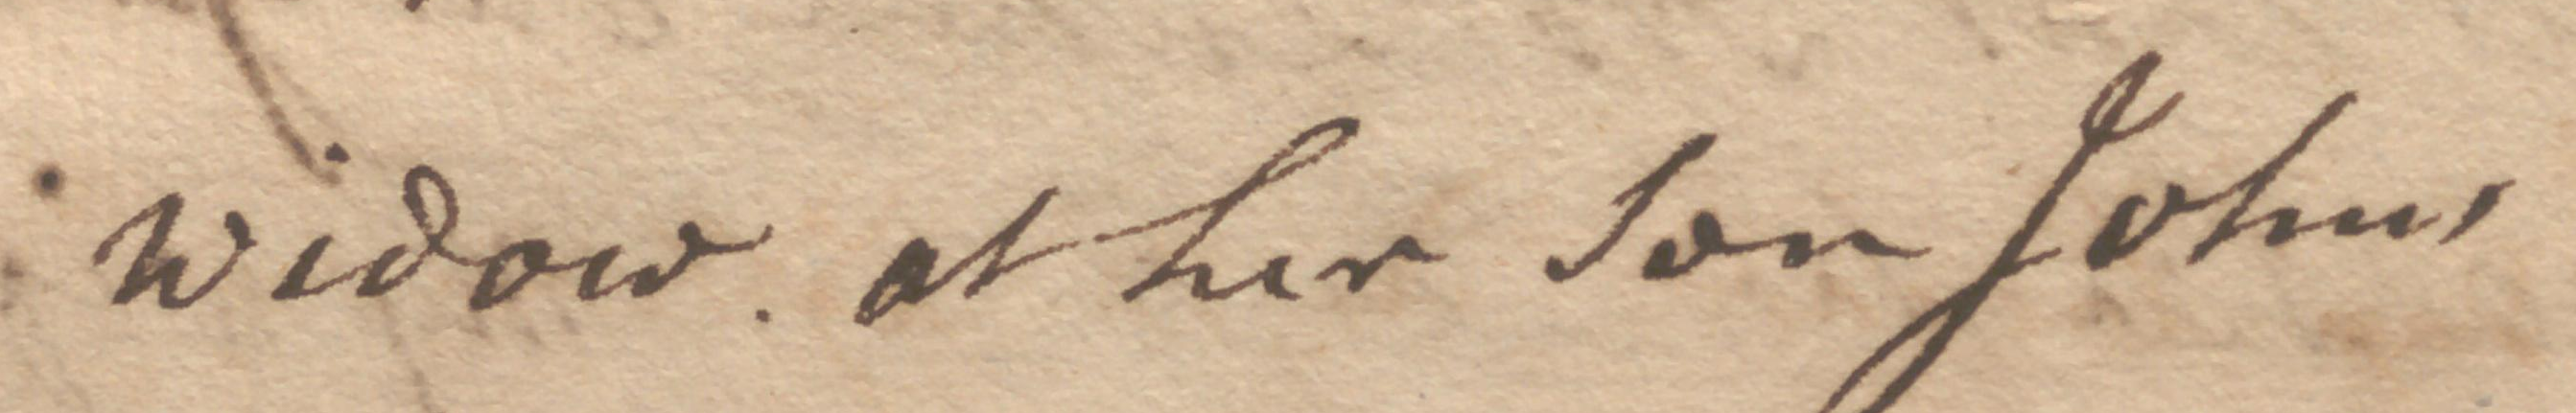widow at her son Johns
